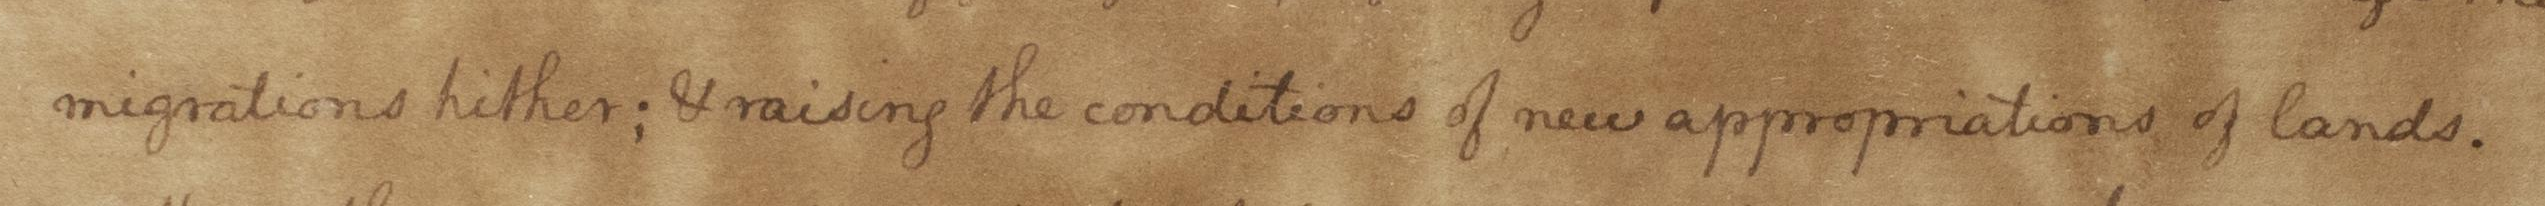migrations hither; & raising the conditions of new appropriations of lands.
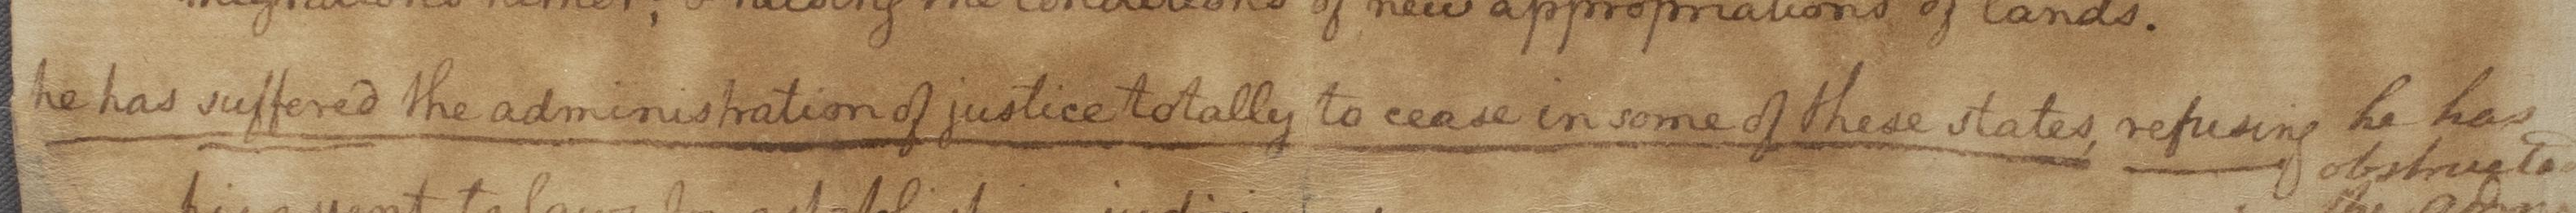he has suffered the administration of justice totally to cease in some If these states refusing he has
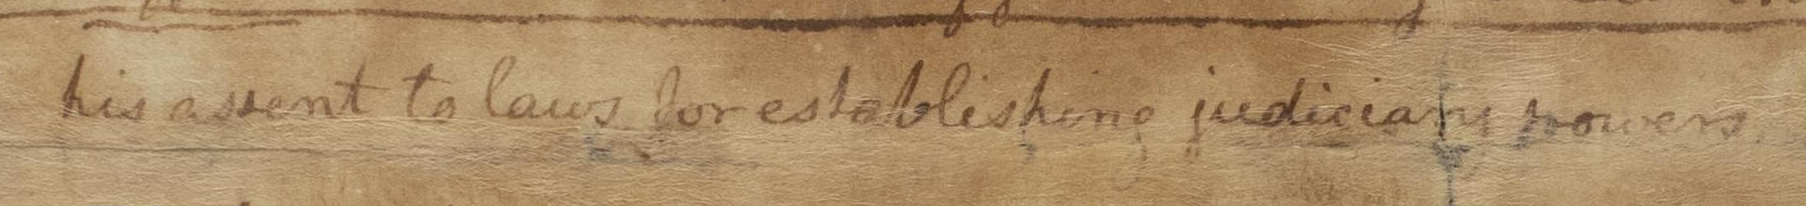his assent to laws for establishing judiciary powers.
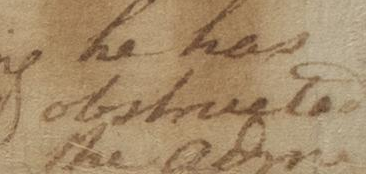obstructed
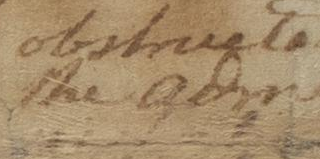the admin-
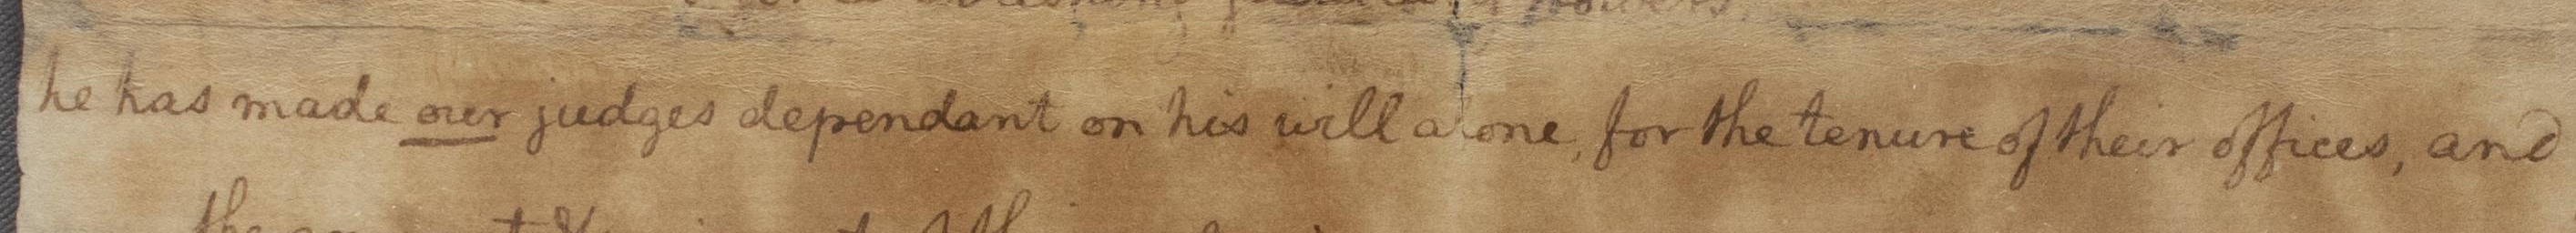he has made our judges dependent on his will alone for the tenure of their offices,
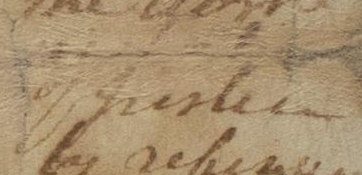of justice
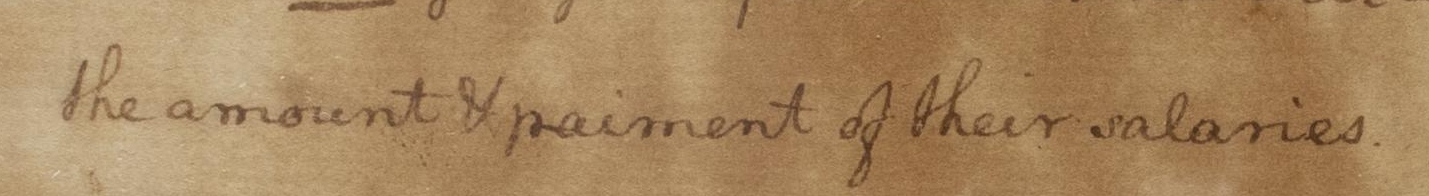the amount & paiment of their salaries.
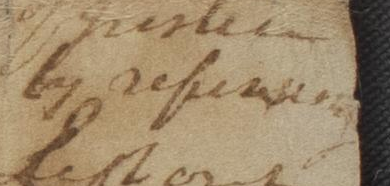by refusing
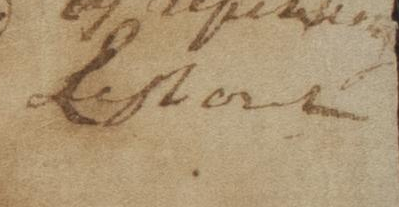Left out
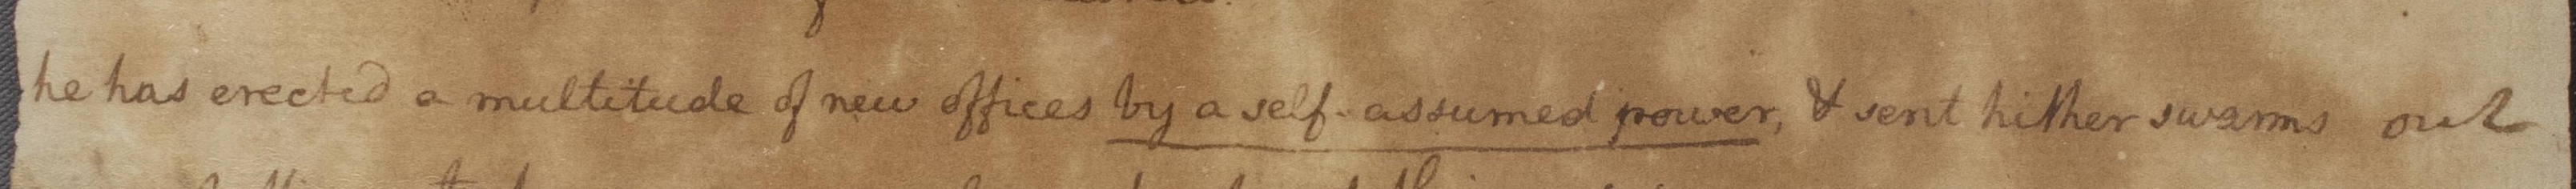he has erected a multitude of new offices by a self assumed power, & sent hither swarms out
